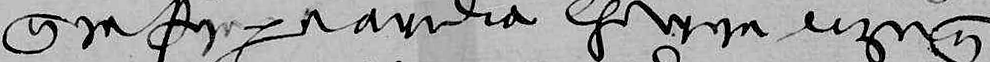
gora fora ꝑa a yndia lhe vyera dizer q̄
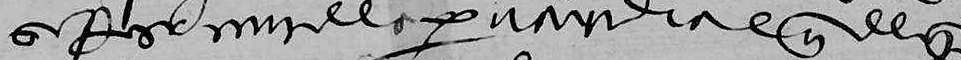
se fose com ella ꝑa a yndia e q̄ ella p̄o
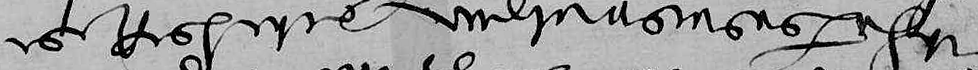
ese Respeyto vendera as casas ꝑa hyr
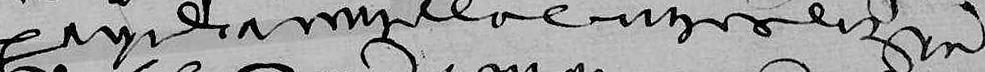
ꝑ a yndia com ella e outros dizyā
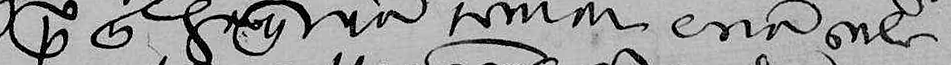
p̄oq̄ lhas q̄ryā tomar e nā sabe
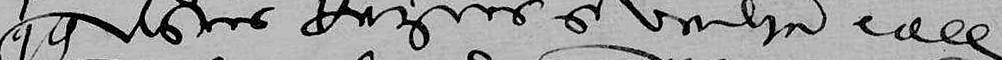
q̄ll destas Razões se venderā e all
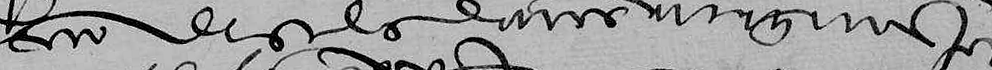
n̄o dise dos ditos artyguos Jor
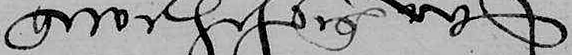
ge coelho ho esp̄vy
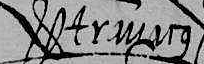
trauaçꝯ
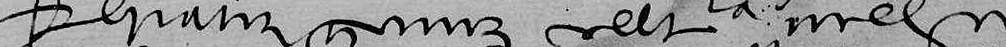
item briatiz gomez solltra molher
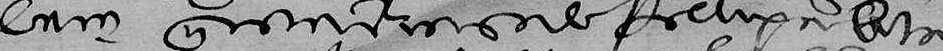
baça q̄ esta ē casa de fellipa Bota
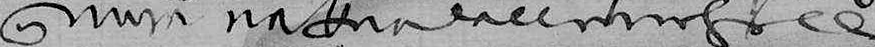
q̄ mora na Rua dallconchell
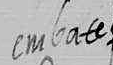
embates
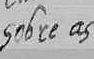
sobre as
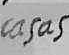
casas
